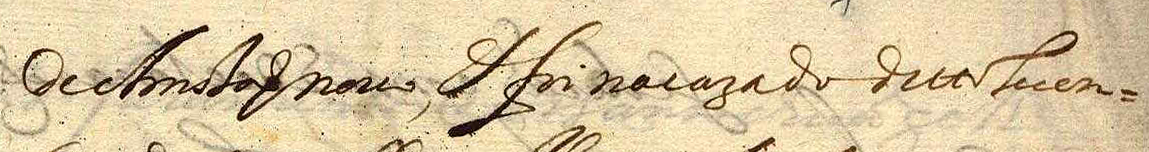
de christaõ nouo, & foi na caza do ditto lecen
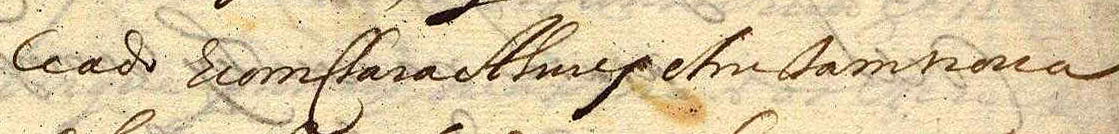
ceado E com Clara Alures christam noua
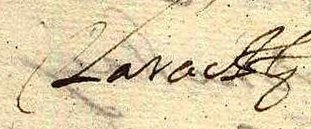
CLara Alz̄
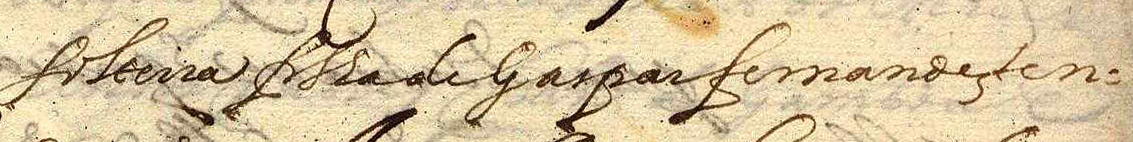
solteira filha de Gaspar fernandez ten
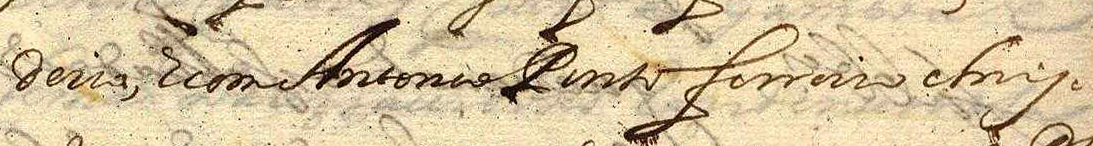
deiro, E com Antonio Pinto ferreiro chris
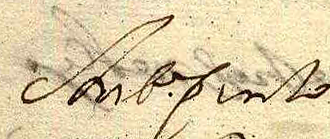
Anto. pinto
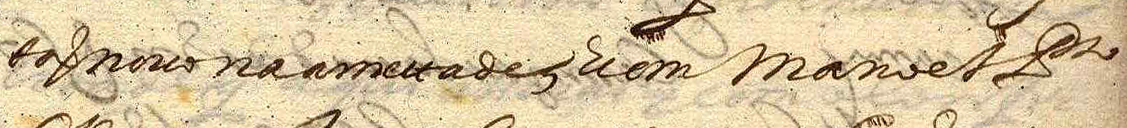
taõ nouo na amettade, E com manoel Pto
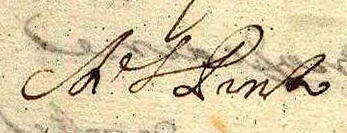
Mel Pinto
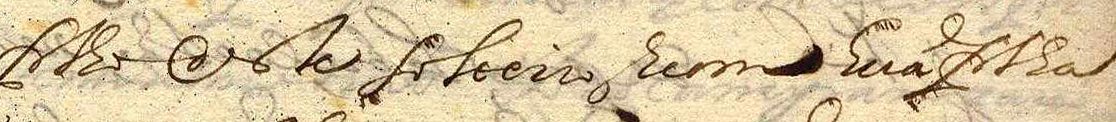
filho deste solteiro, E com huā filha
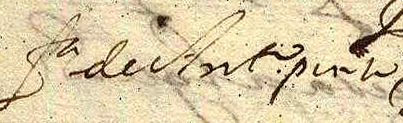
fa de Anto. pinto
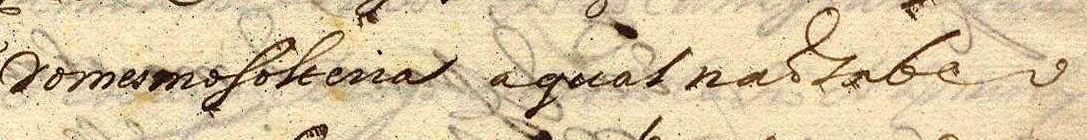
do mesmo solteira a qual não sabe o
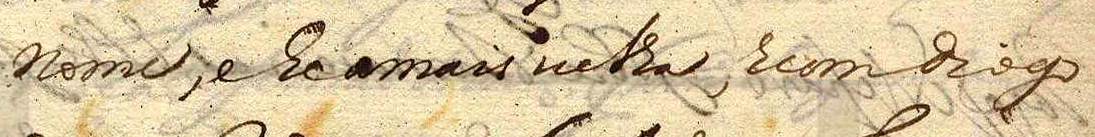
nome, e he a mais uelha, E com diogo
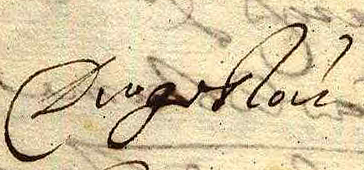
Diogo Roiz̄
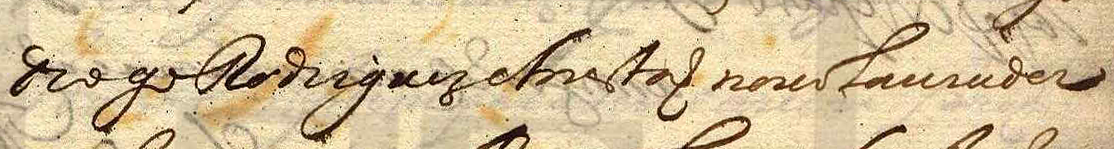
diogo Rodriguez christaõ nouo Laurador
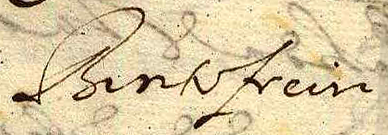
Bento freire
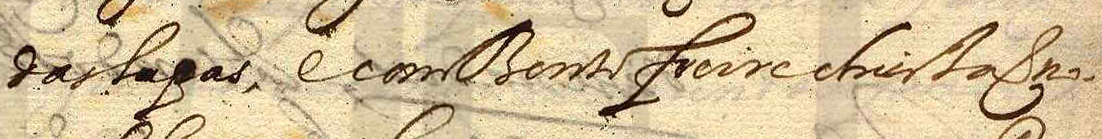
das lapas, e com Bento freire christaõ no
